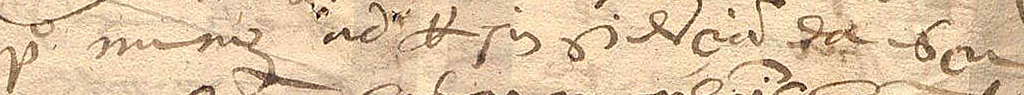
po nunez ad Rejmsidēciā da escu
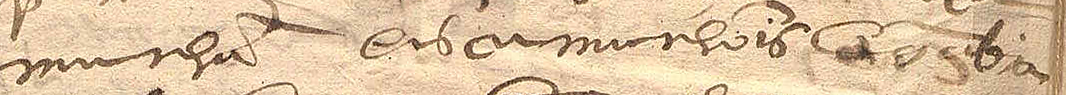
munhaõ e escumonhoĩs ē q̄ avia
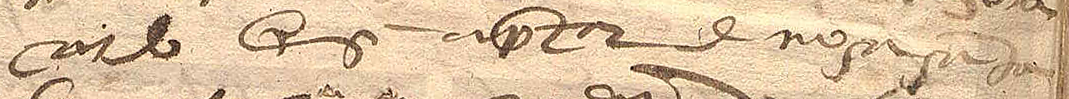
caido ē se ap̄tar de nosa sāta
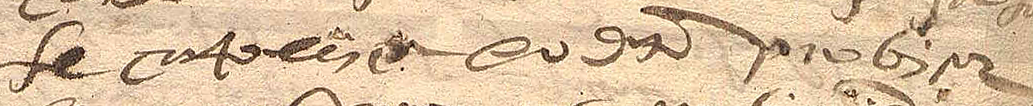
fe catolljca e o dit̄o provisor
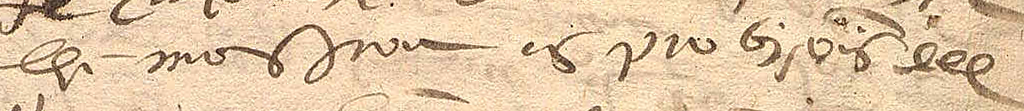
lhe mostrou as provisoĩs dell
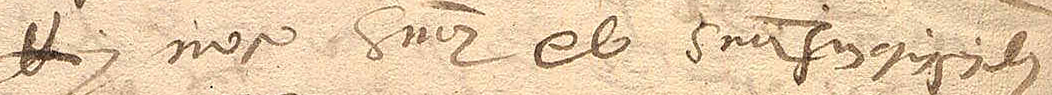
Rej noso Snōr e do Snōr Jnqujsjdor
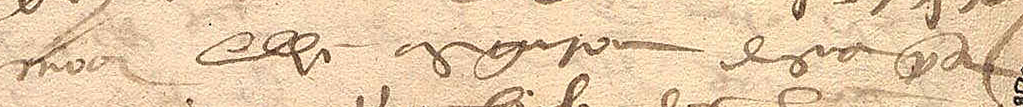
moor e lhe asegurou de sua p̄te
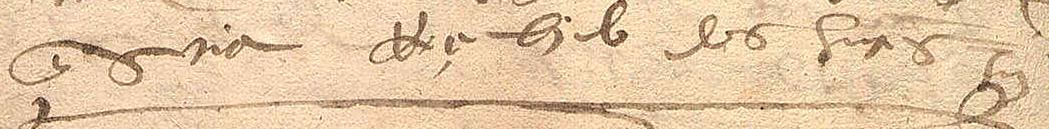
q̄ seria Recebido dos Sores Jn
